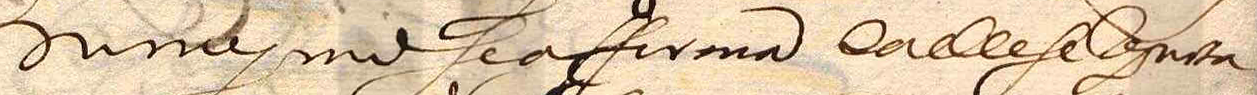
no mesmo se affirma e a elle se Reporta
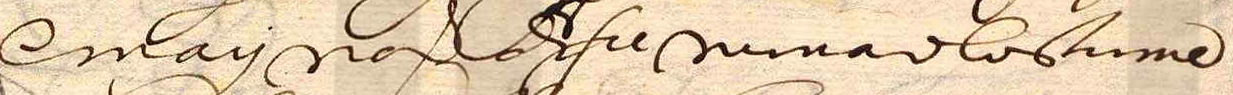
e mais naõ disse nem ao Costume
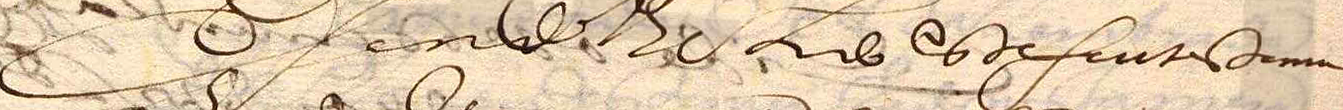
E sendolhe Lido este seu testemu
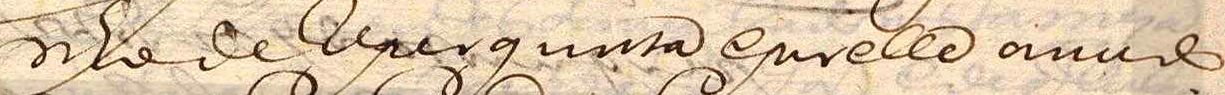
nho de Repergunta e por elle ouuido
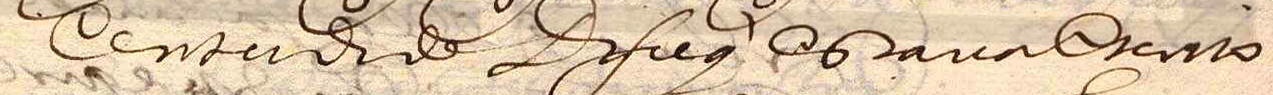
e entendido Disse q̄ estaua escrito
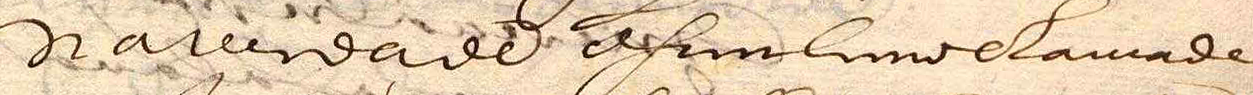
na verdade asim como o havia de
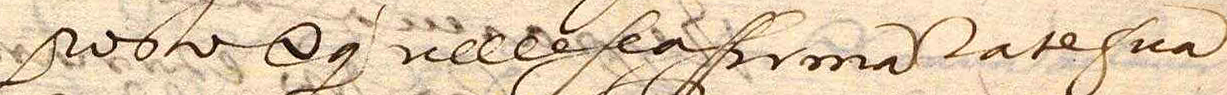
posto e q̄ nelle se affirma Ratefica
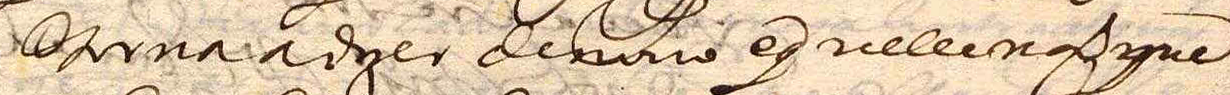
torna a dizer de nouo e q̄ nelle naõ que
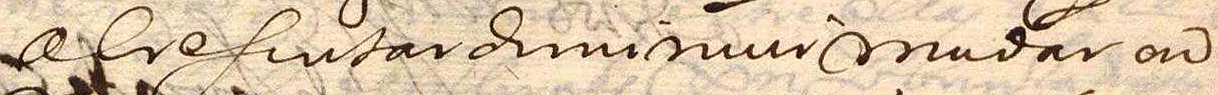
acresentar diminuir mudar ou
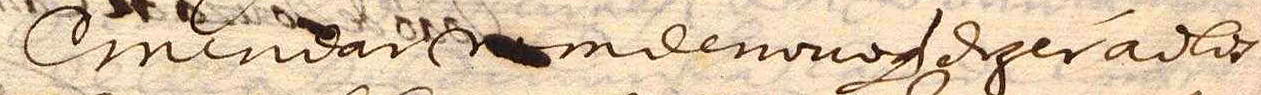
Emendar nem de nouo q̄ dizer ao cos
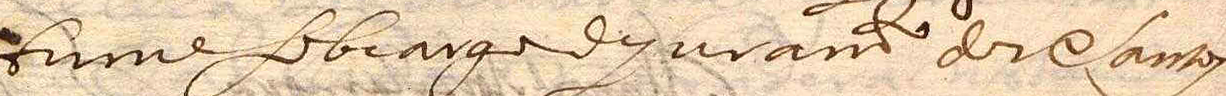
tume sob cargo do juram.to dos Santos
